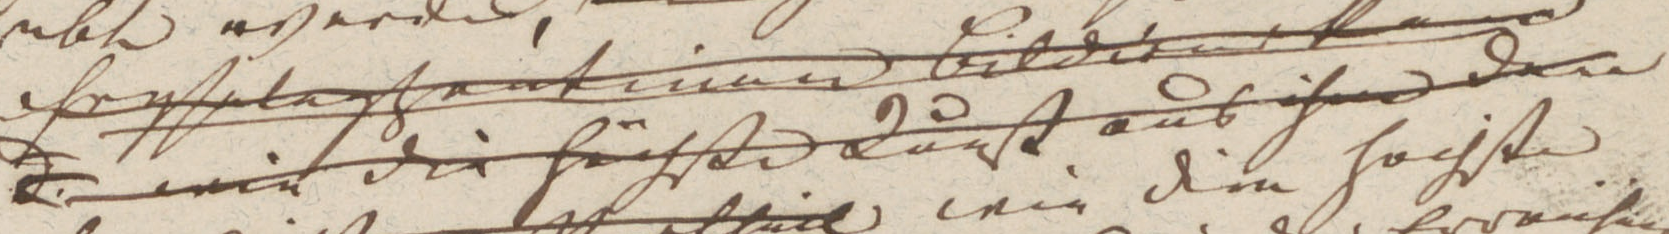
d. wie die höchste Kunst aus ihm den
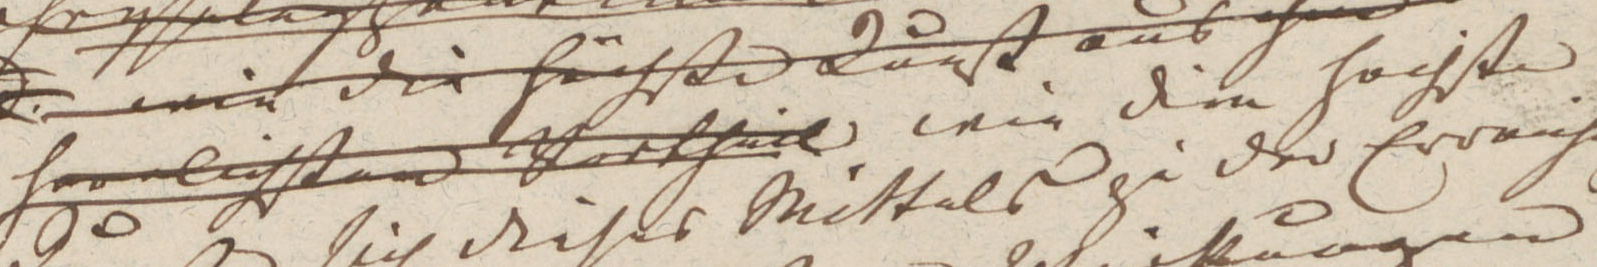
herrlichsten Vortheil wie die höchste
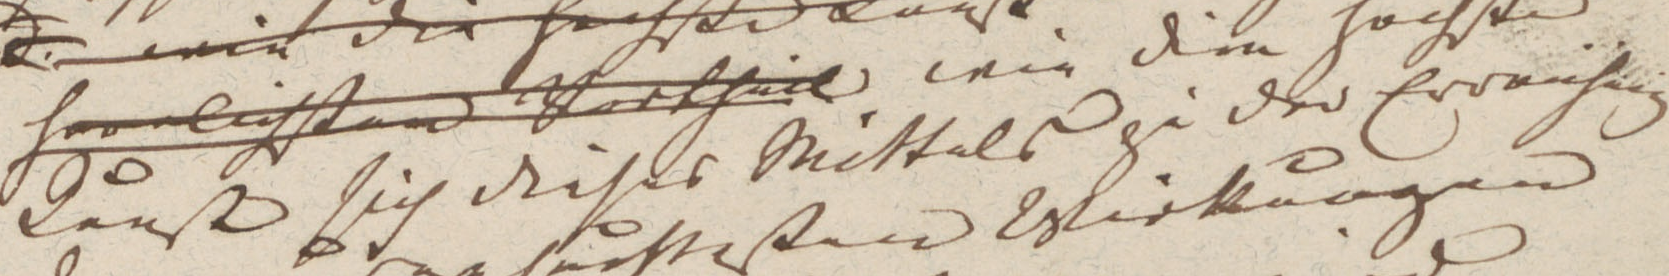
Kunst sich dieses Mittels zu der Erreichung
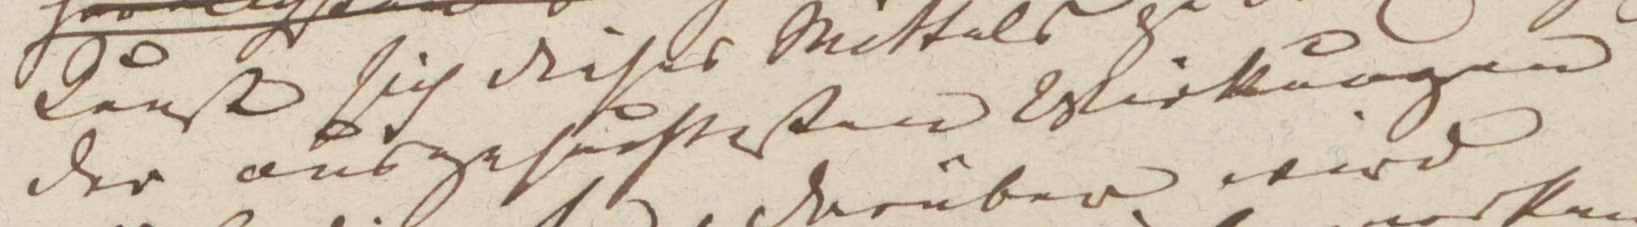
der ausgesuchtesten Wirkungen
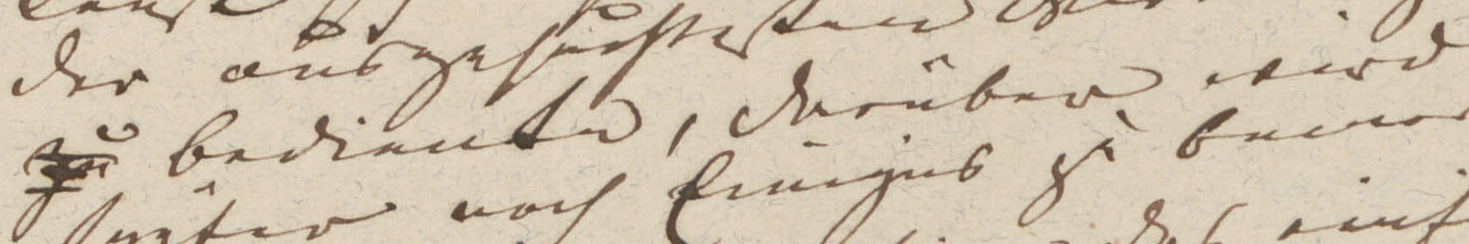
zu bediente, darüber wird
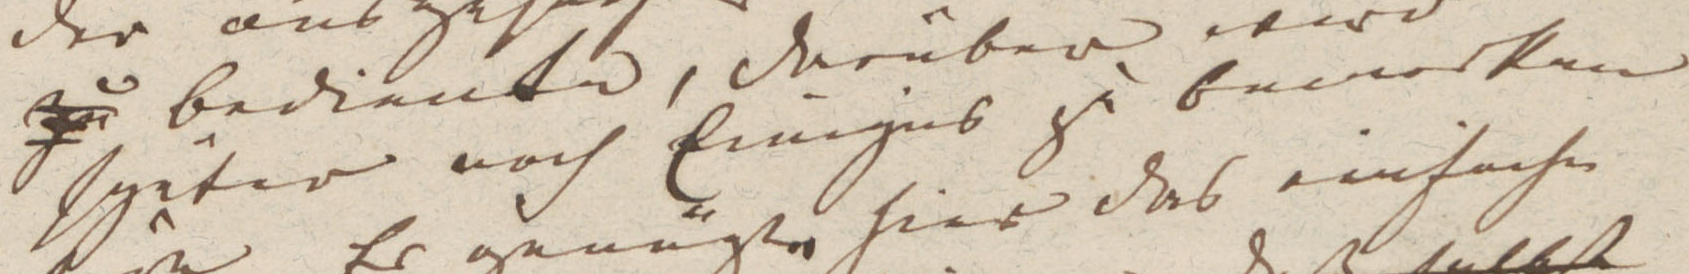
später noch eEiniges zu bemerken
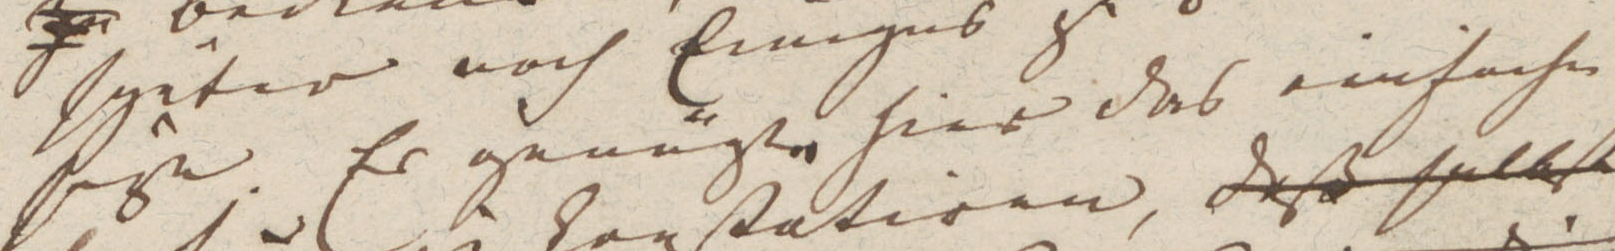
seyn. Es genügte hier das einfache
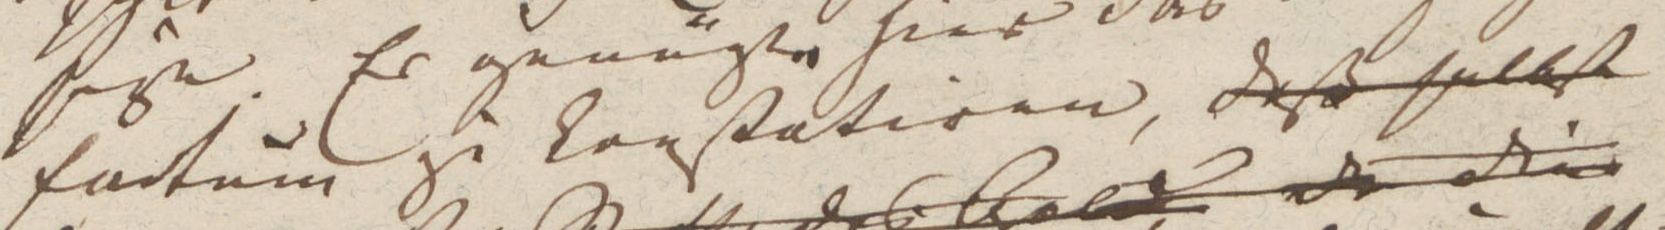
Fatum zu konstatiren, das selbst
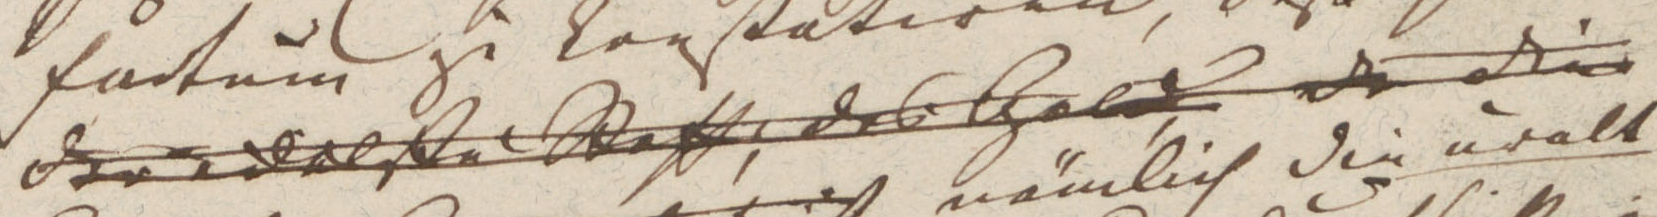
der edelste Stoff, das Gold, da die
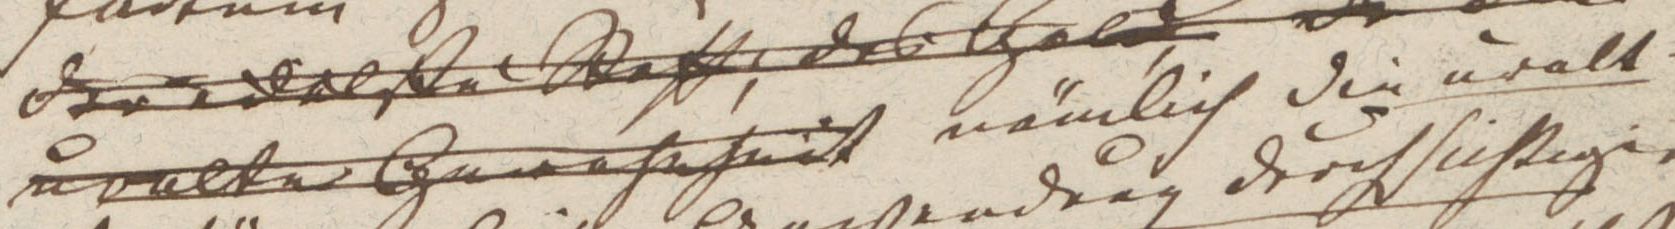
uralte Gewohnheit nämlich die uralt-
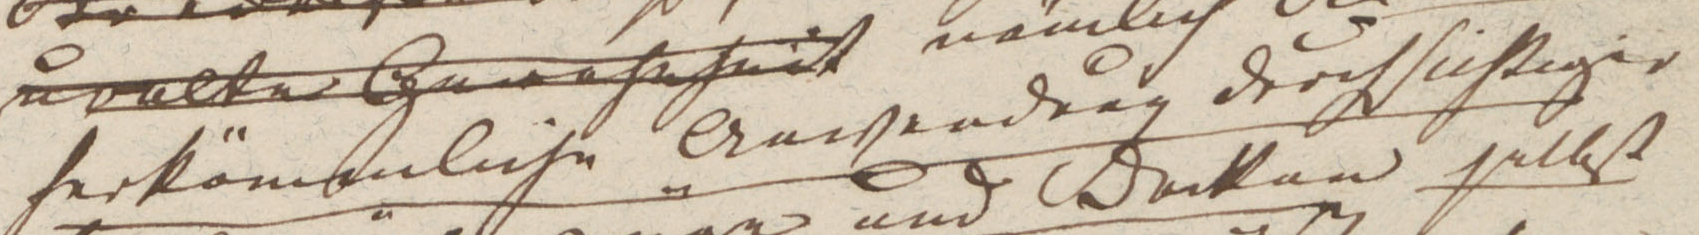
herkömmliche Anwendung durchsichtiger
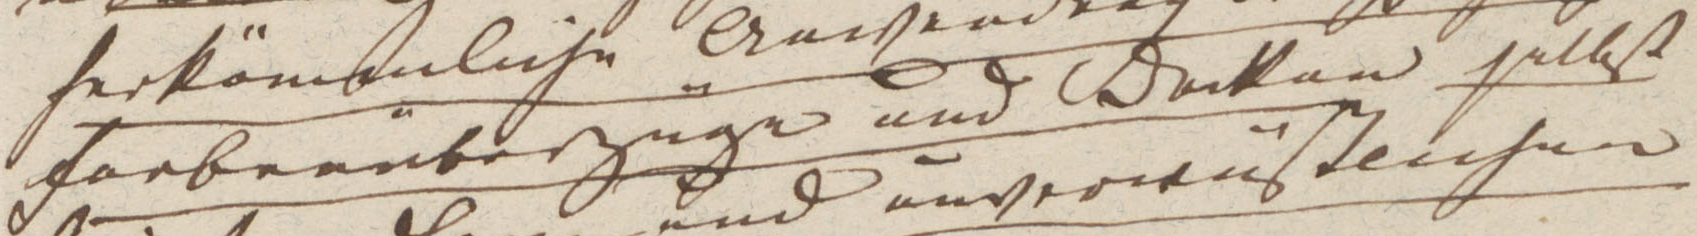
Farbenüberzüge und Decken selbst
